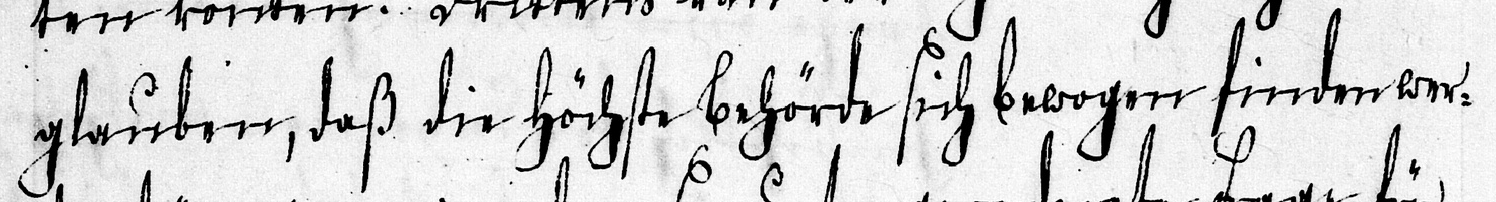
glauben, daß die Höchste Behörde sich bewogen finden wer¬
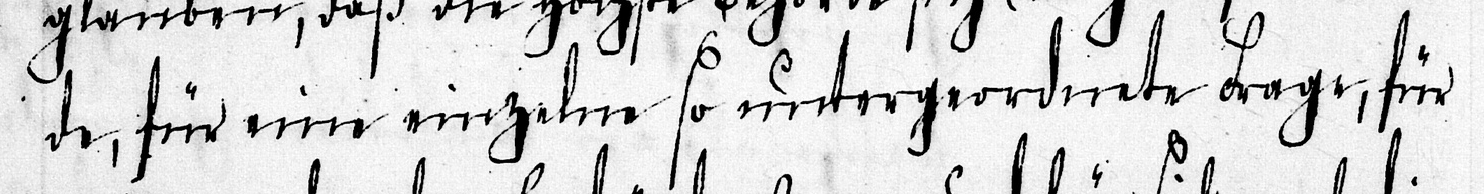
de, für eine einzelne so untergeordnete Frage, für
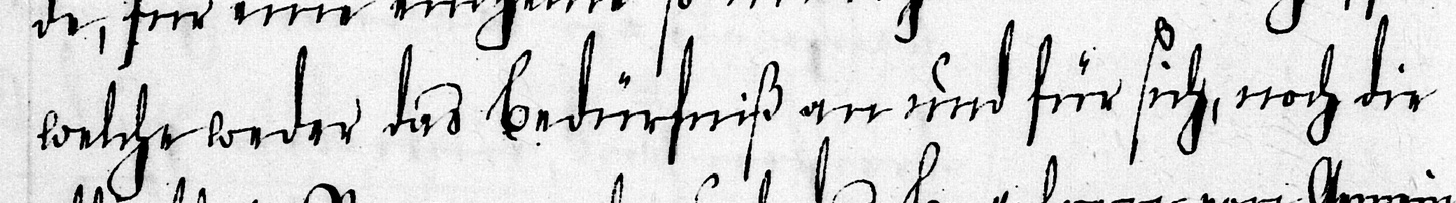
welche weder das Bedürfniß an und für sich, noch die
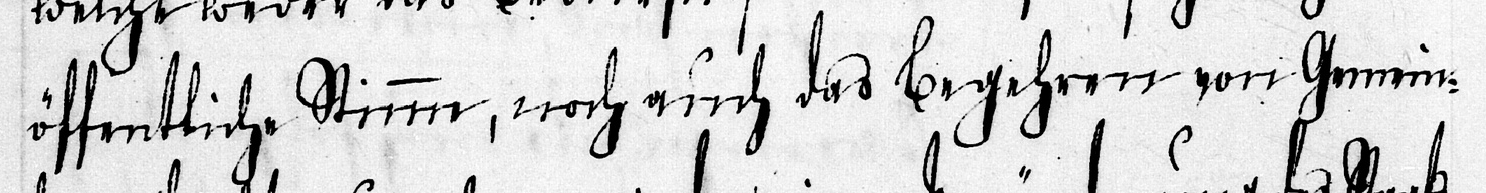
öffentliche Stimme, noch auch das Begehren von Gemein¬
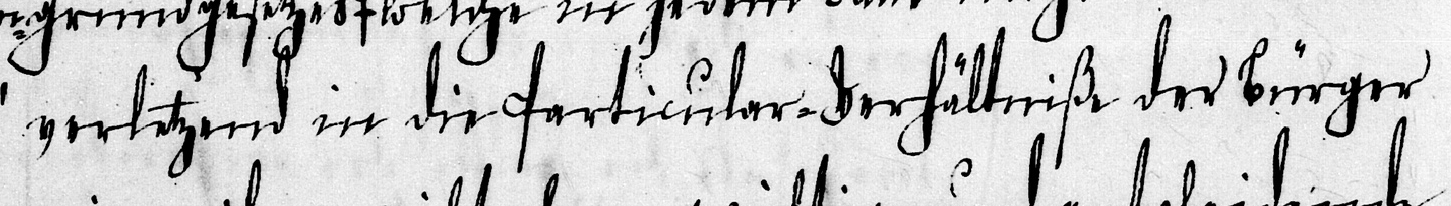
verletzend in die Particular-Verhältniße der Bürger
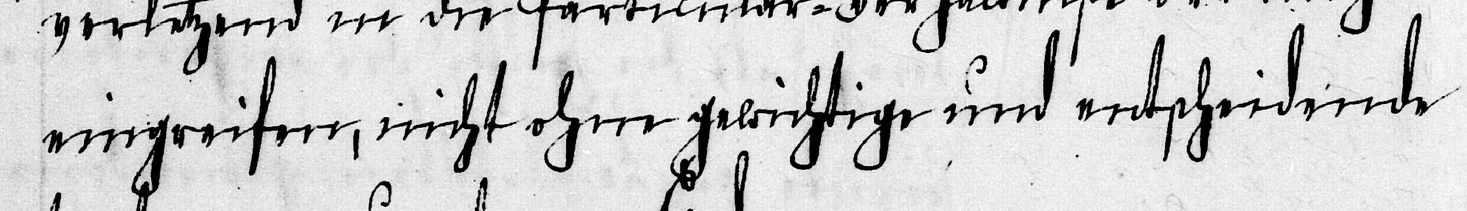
eingreifen, nicht ohne gewichtige und entscheidende
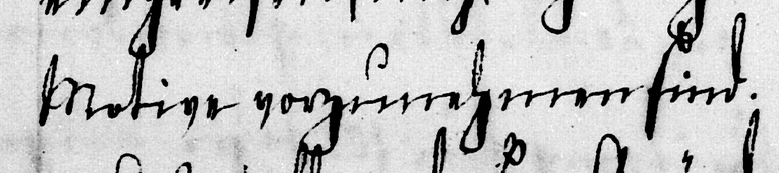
Motive vorzunehmen sind.
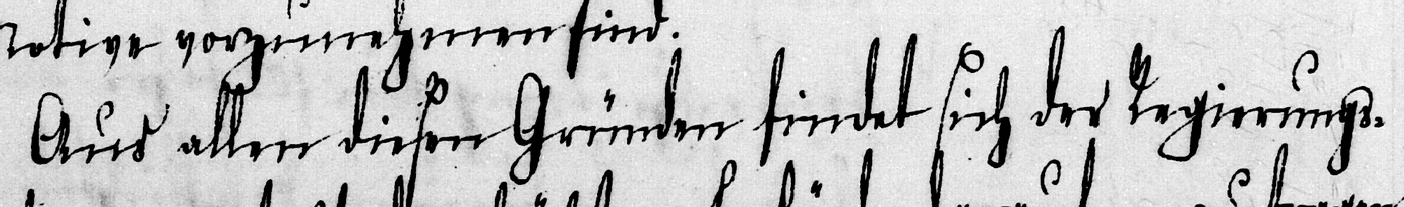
Aus allen diesen Gründen findet sich der Regierungs¬
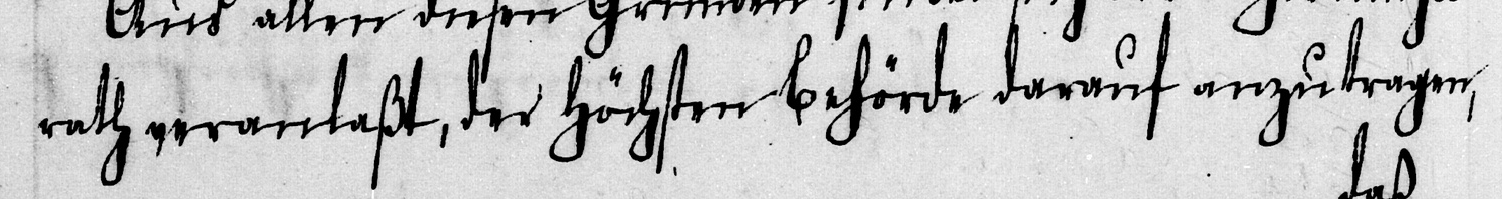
rath veranlaßt, der Höchsten Behörde darauf anzutragen,
